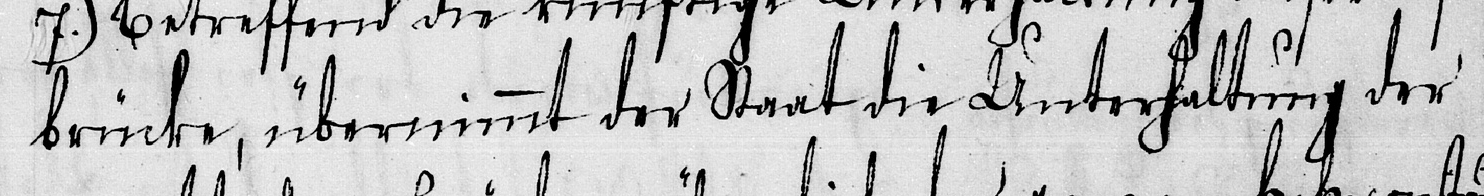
brücke, übernimmt der Staat die Unterhaltung der
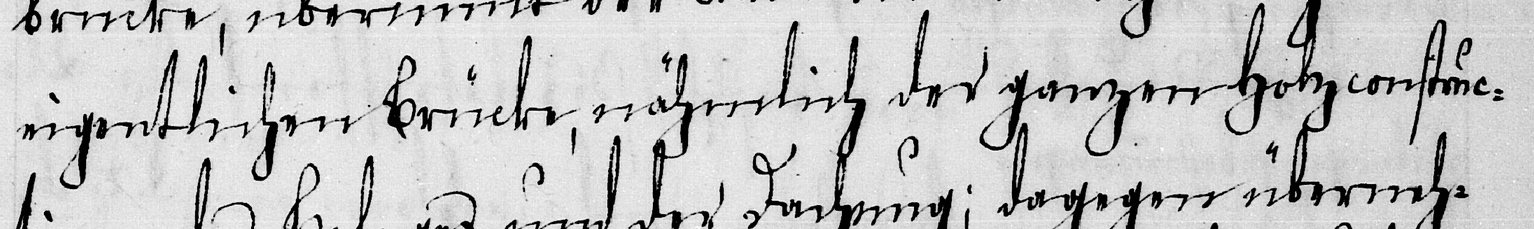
eigentlichen Brücke, nähmlich der ganzen Holzconstru¬
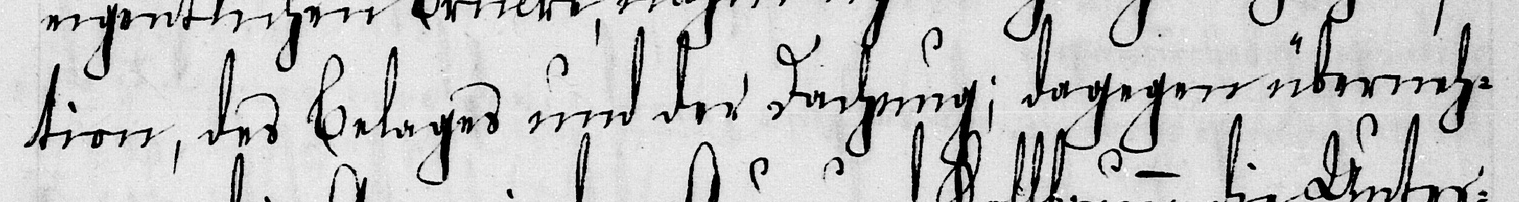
ction, des Belages und der Dachung; dagegen überneh¬
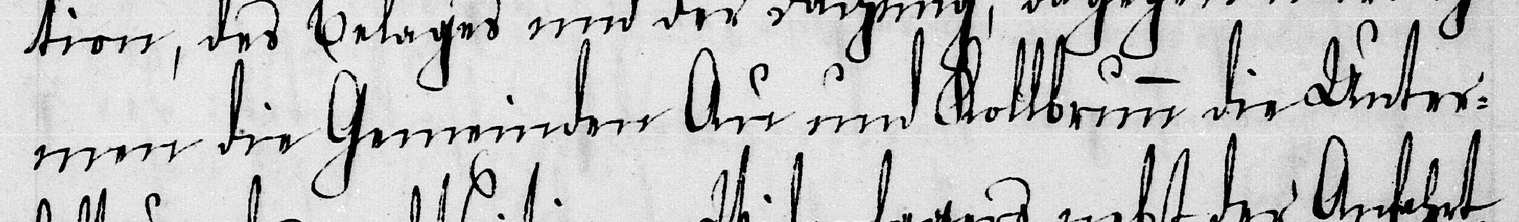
men die Gemeinden Au und Kollbrunn die Unter¬
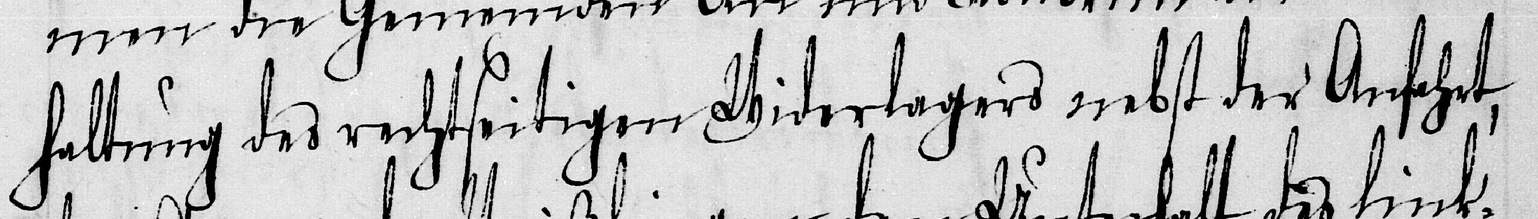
haltung des rechtseitigen Widerlagers nebst der Anfahrt,
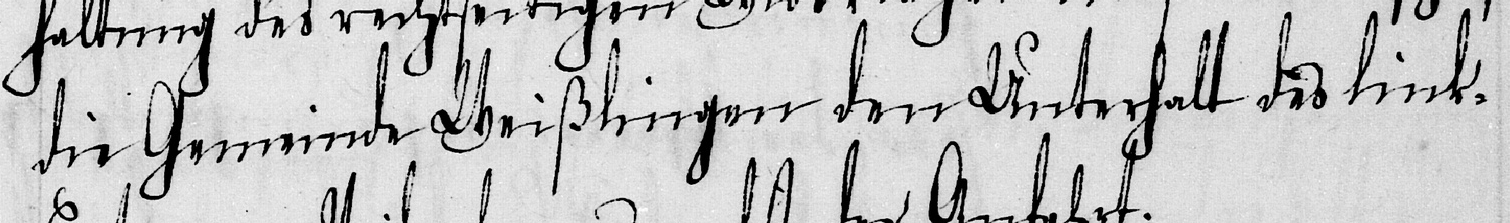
die Gemeinde Weißlingen den Unterhalt des link¬
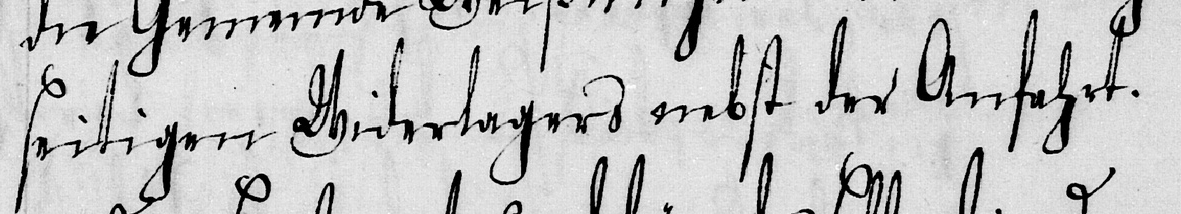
seitigen Widerlagers nebst der Anfahrt.
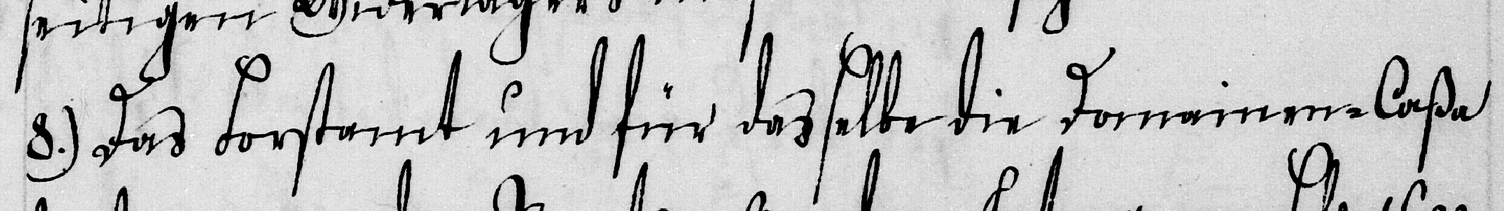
8.) Das Forstamt und für dasselbe die Domainen-Caßa
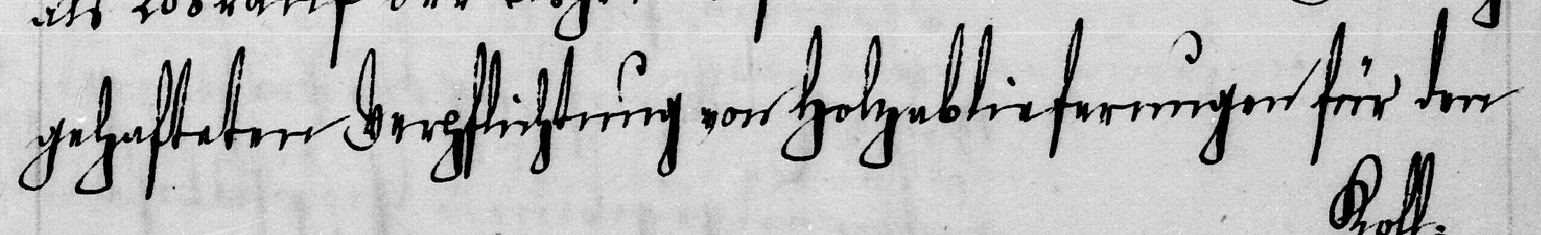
gehafteten Verpflichtung von Holzablieferungen für den
